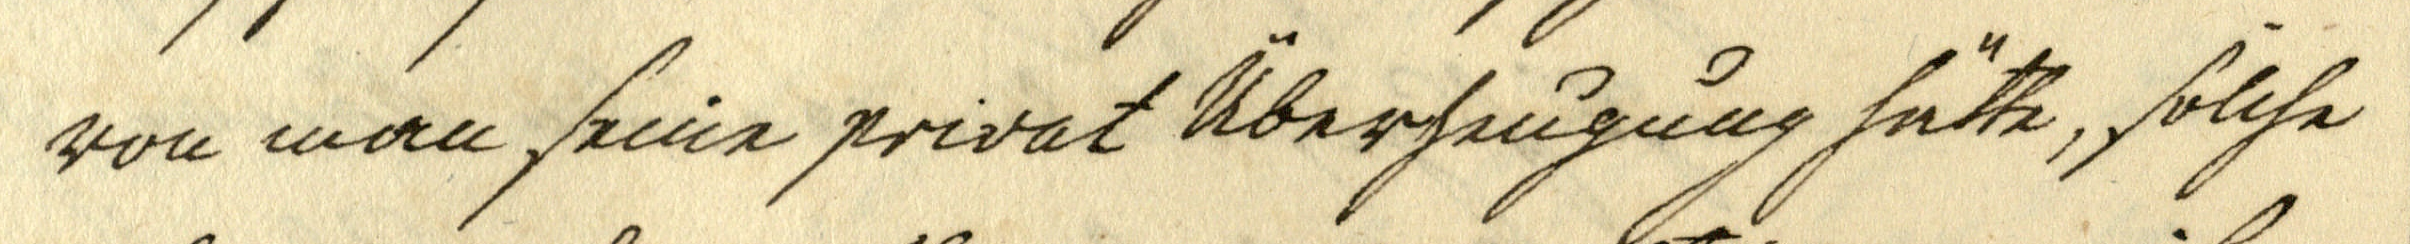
von man seine privat Überzeugung hätte, solche
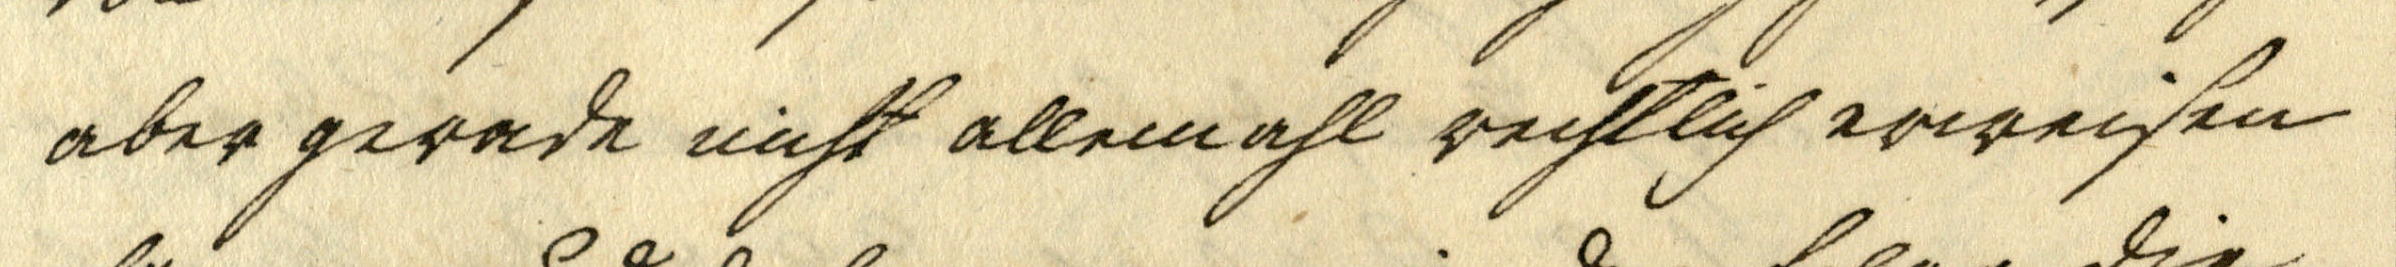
aber gerade nicht allemahl rechtlich erweisen
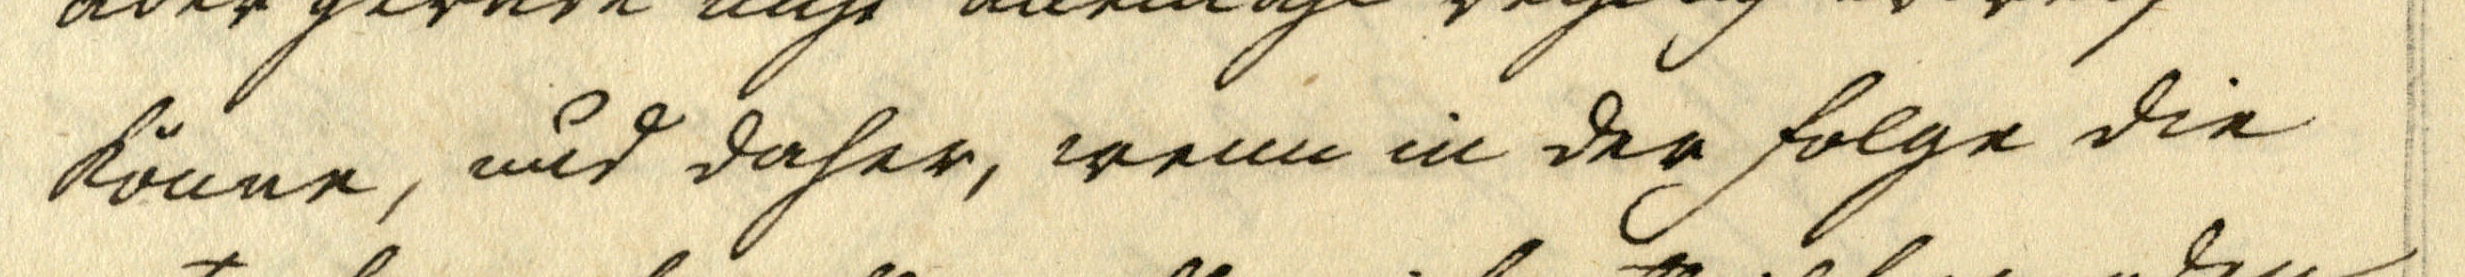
könne, und daher, wenn in der Folge die
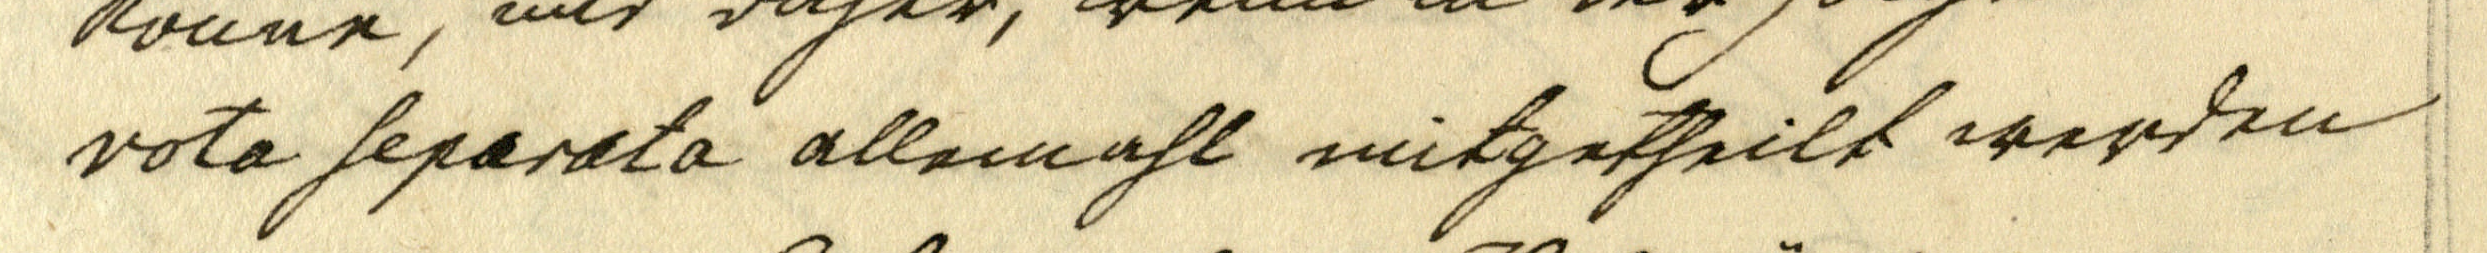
vota separata allemahl mitgetheilt werden
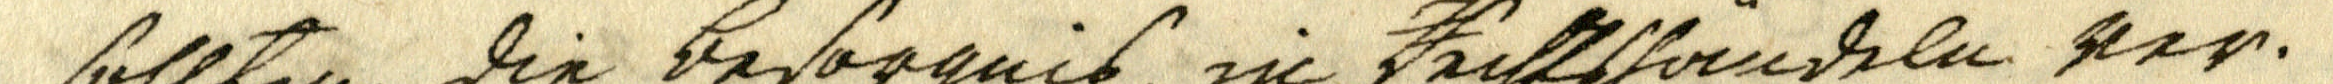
sollten, die Besorgnis, in Rechtshändeln ver¬
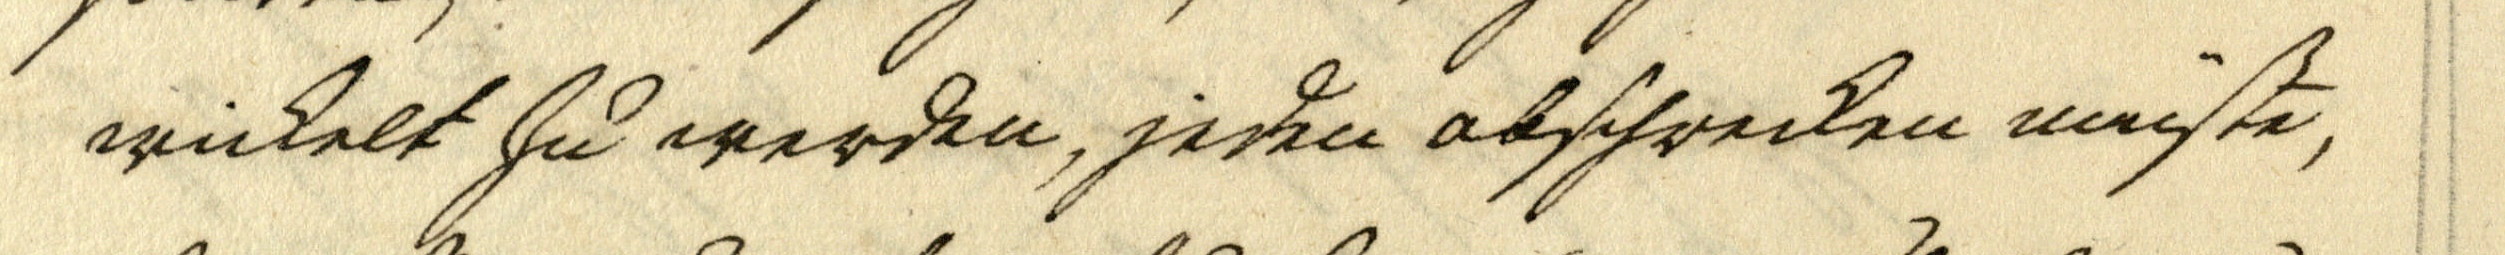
wickelt zu werden, jeden abschrecken müßte,
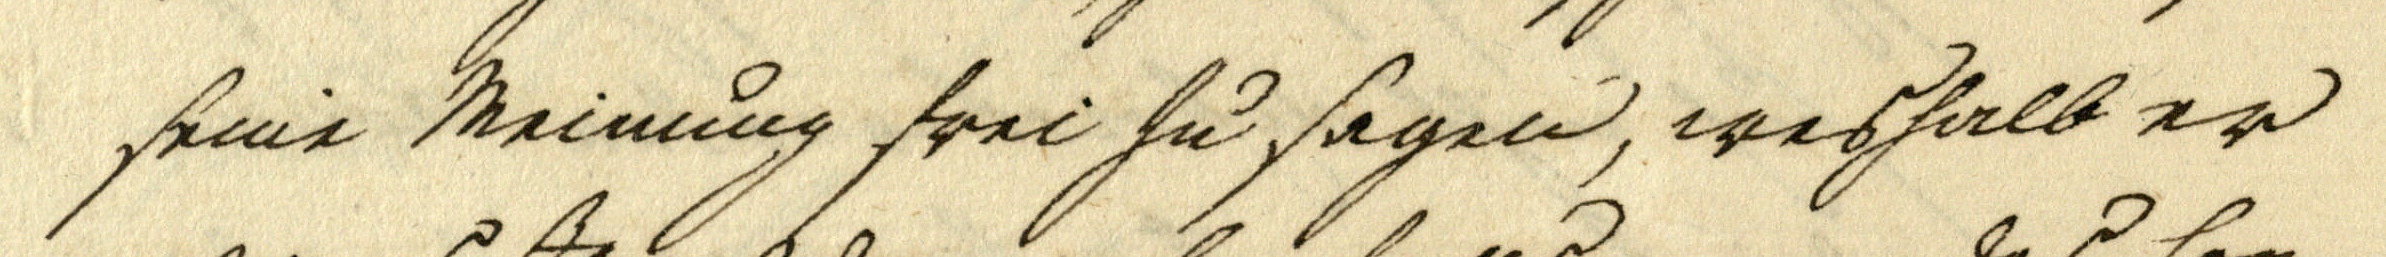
seine Meinung frei zu sagen, weshalb er
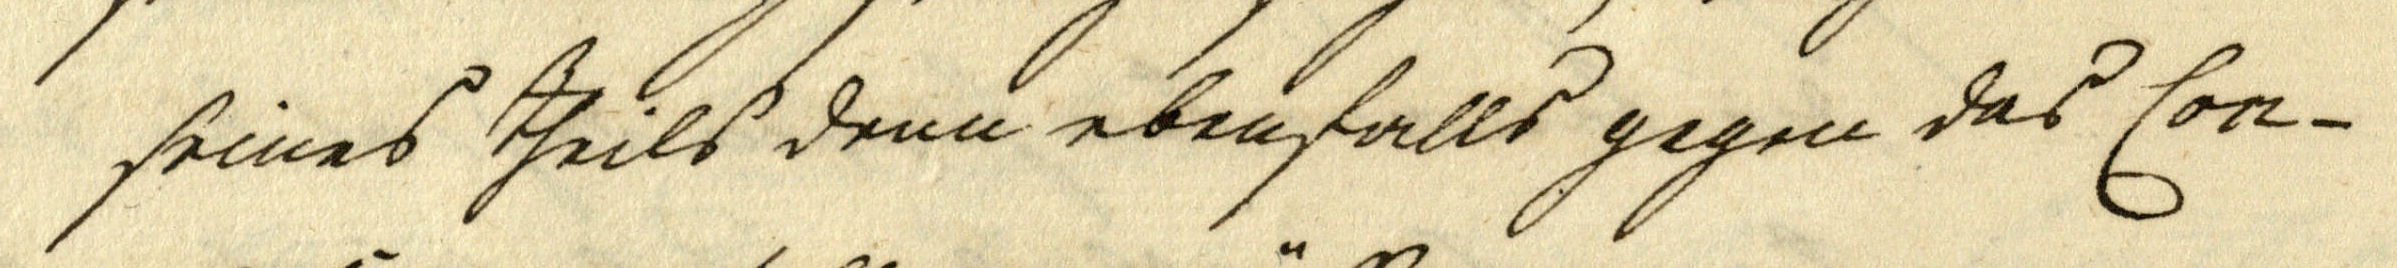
seines Theils denn ebenfalls gegen des Con¬
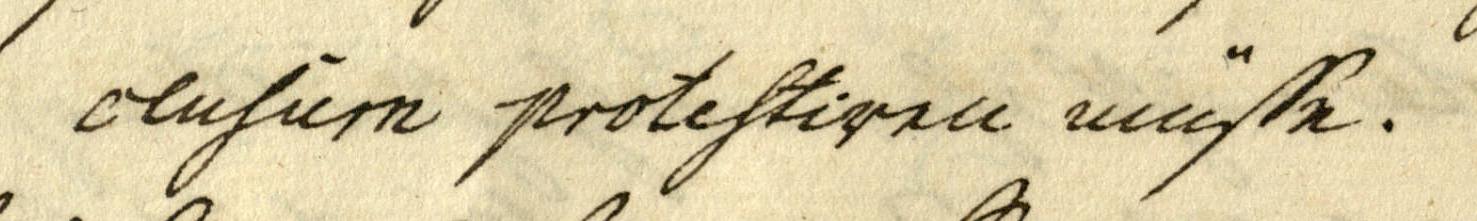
clusum protestiren müsse.
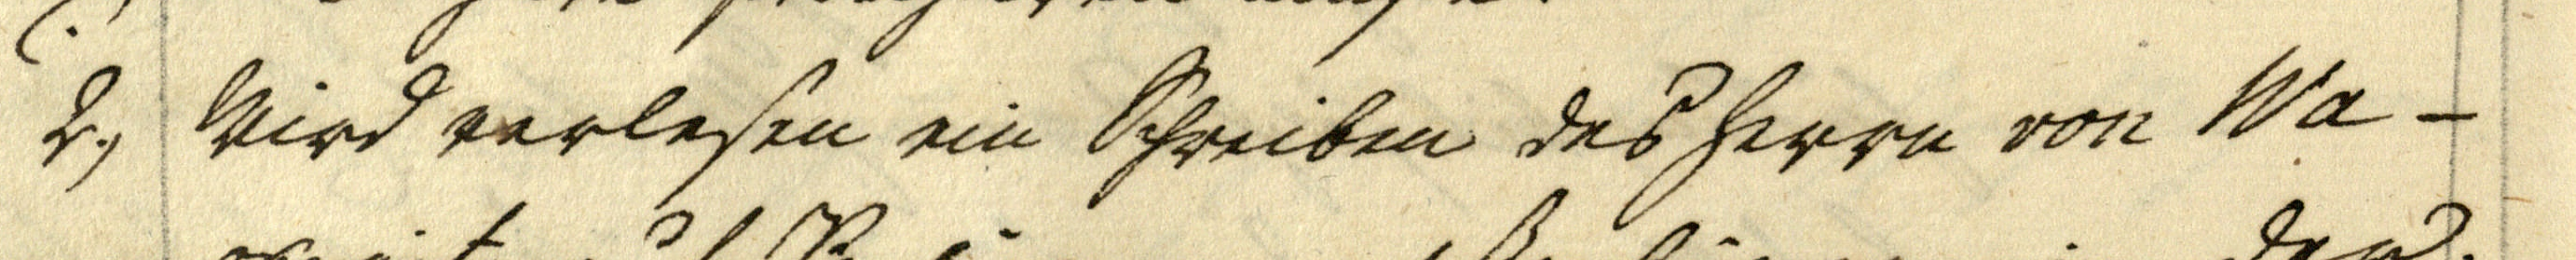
2., Wird verlesen ein Schreiben des Herrn von Wa¬
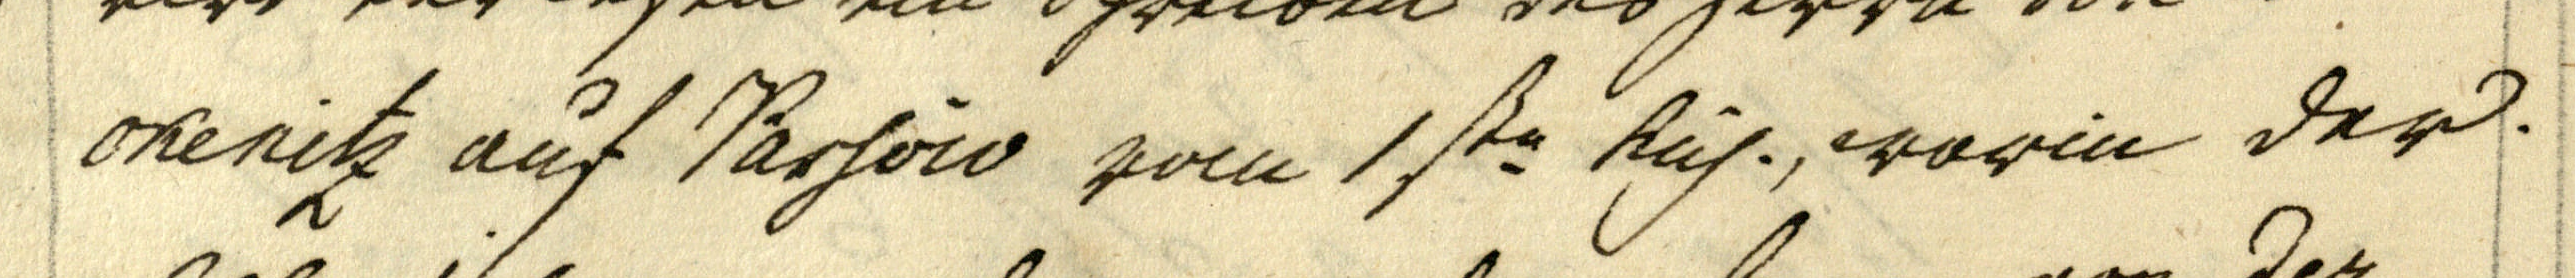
ckenitz auf Passow vom 1 sten huj. worin der¬
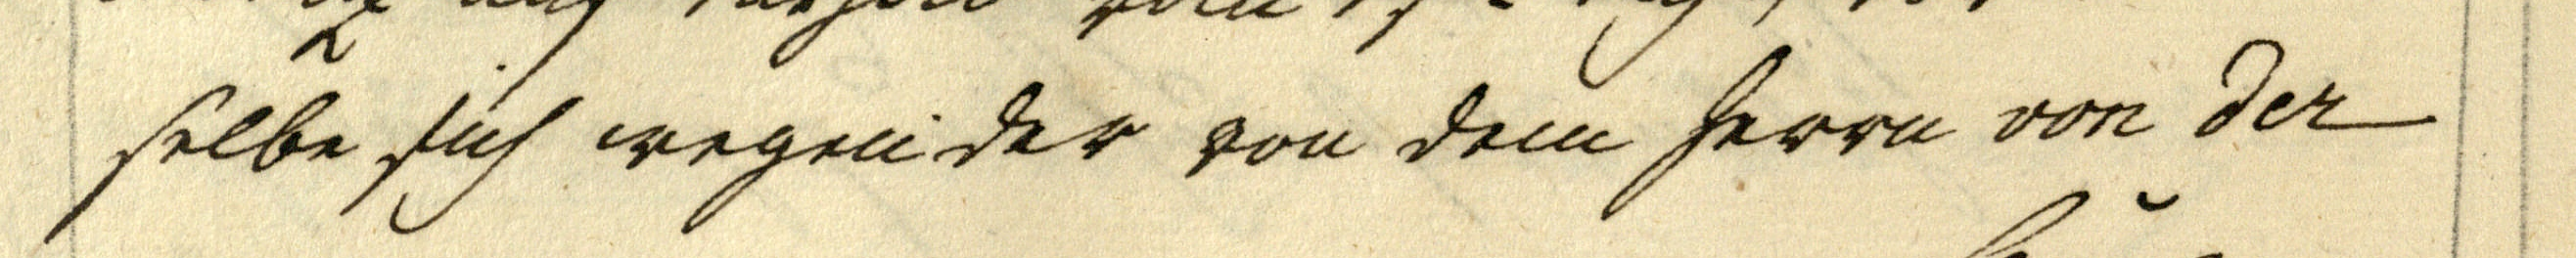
selbe sich wegen der von dem Herrn von der
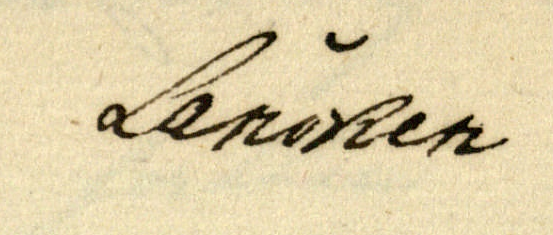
Lancken
